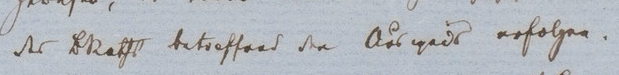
des BRaths betreffend den Ausweis erfolgen.
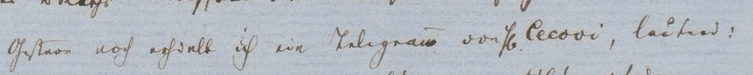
Gestern noch erhielt ich ein Telegramm von H. Cecovi, lautend:
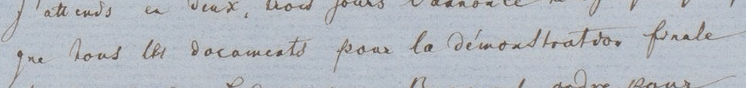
que tous les documents pour la démonstration finale
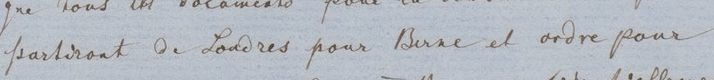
partiront de Londres pour Berne et ordre pour
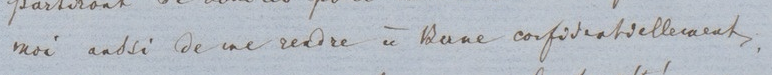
moi aussi de me rendre à Berne confidentiellement.
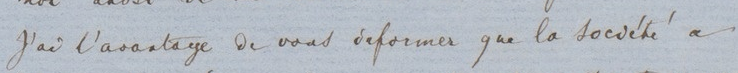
J'ai l'avantage de vous informer que la société a
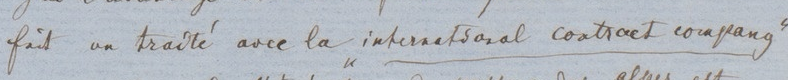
fait un traité avec la «international contract company»
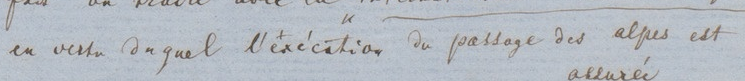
en vertu duquel l'exécution du passage des alpes est
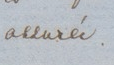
assurée.
